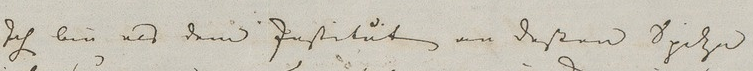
Ich bin es dem Institut an deßen Spitze
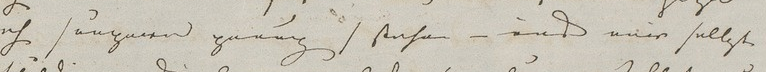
ich (ungern genug) stehe – und mir selbst
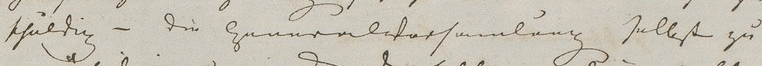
schuldig – die GeneralVersamlung selbst zu
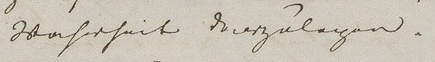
Wahrheit darzulegen. –
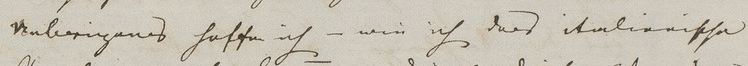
Uebrigens hoffe ich – wie ich das italienische
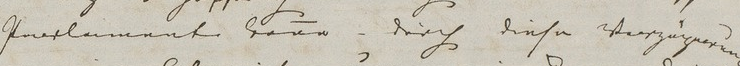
Parlament kenne – durch diese Verzögerung
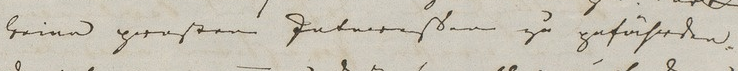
keine großen Interessen zu gefährden.
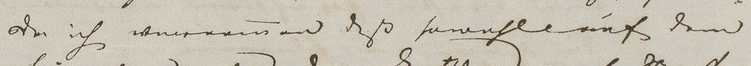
Da ich vernommen daß sowohl auf dem
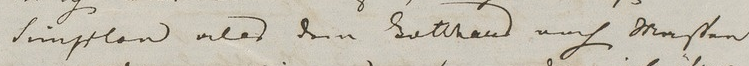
Simplon als dem Gotthard noch Maßen
